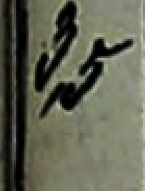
3,5
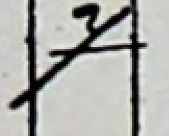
7
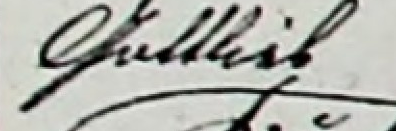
Gottlieb
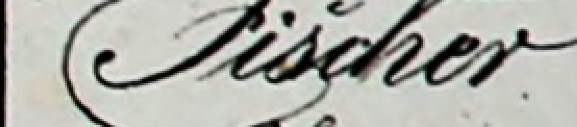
Fischer
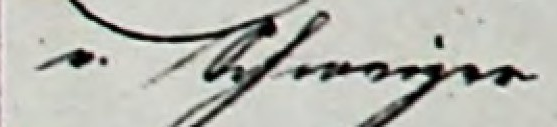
v. Schweiger
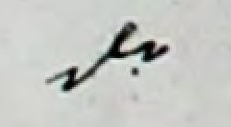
do
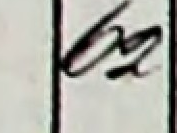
62
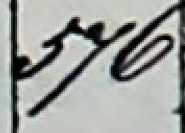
576
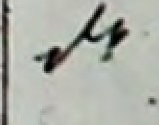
do
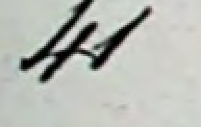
41
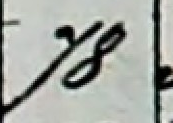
78
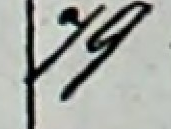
79
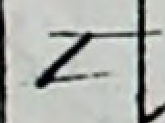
I
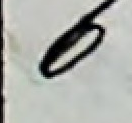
6
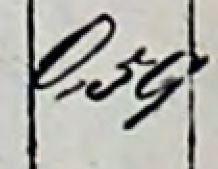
0,59
